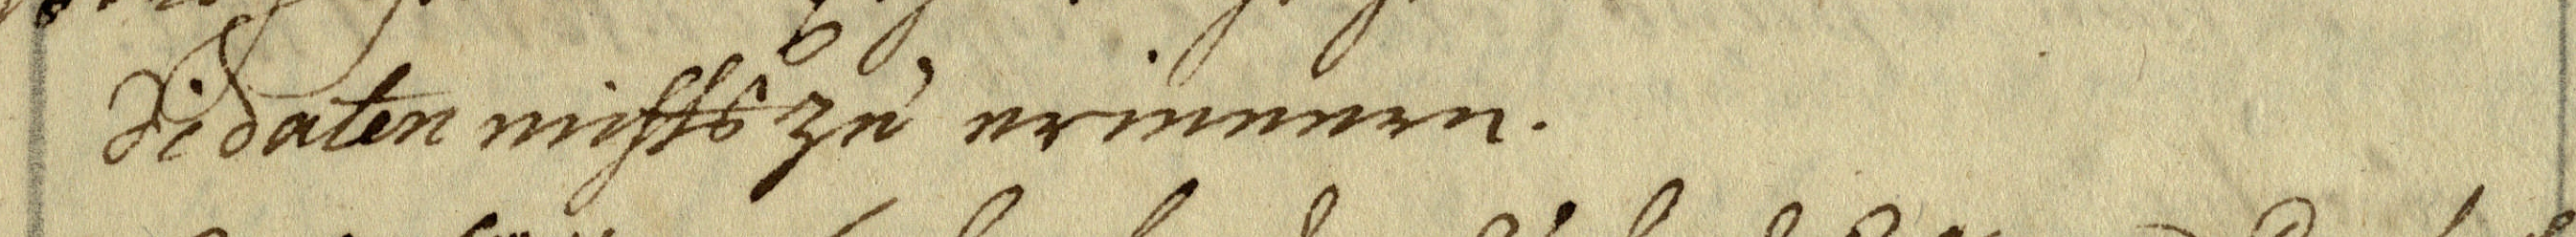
didaten nichts zu erinnern.
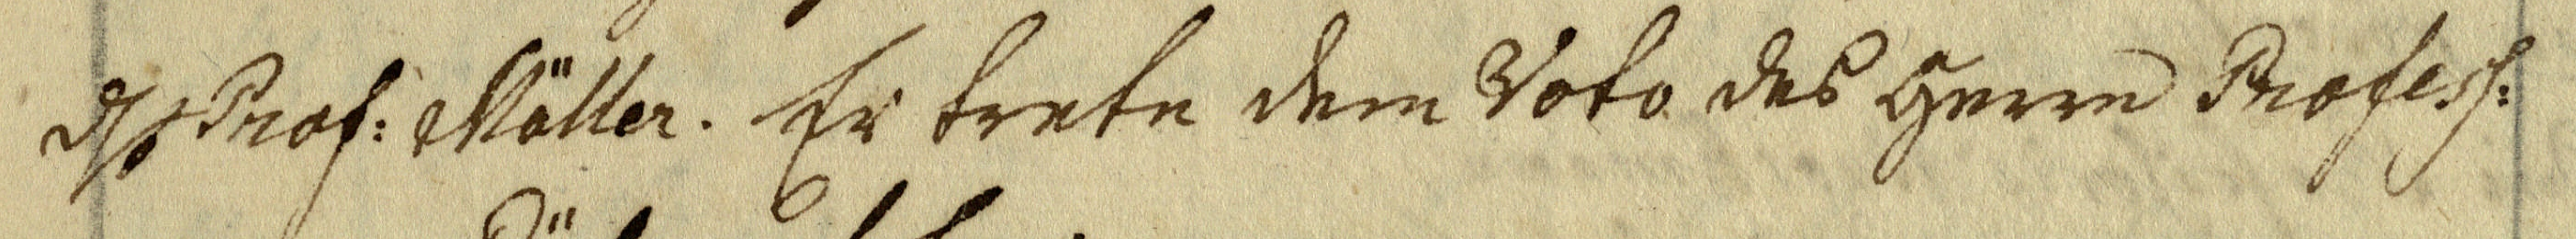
dh. Prof. Möller. Er trete dem Voto des Herrn Profess.
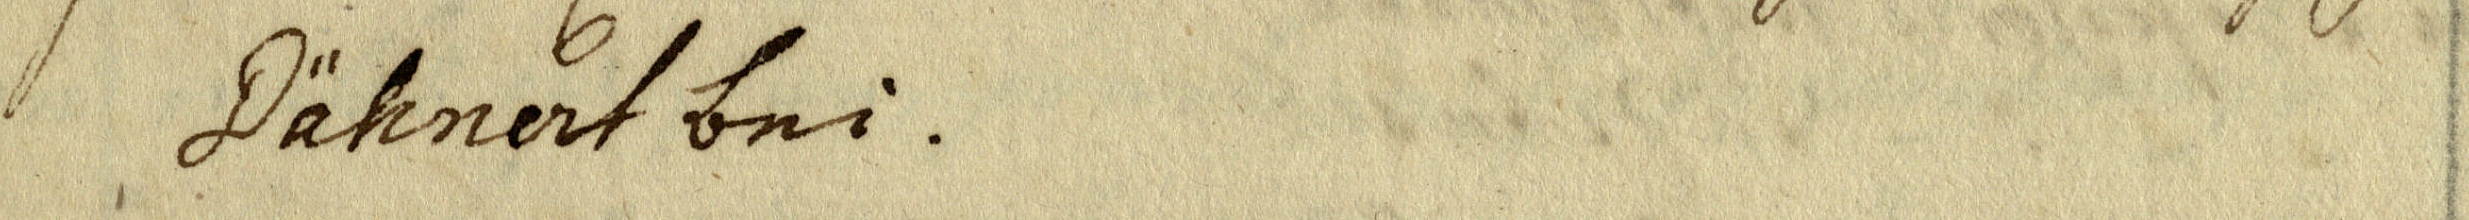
Dähnert bei.
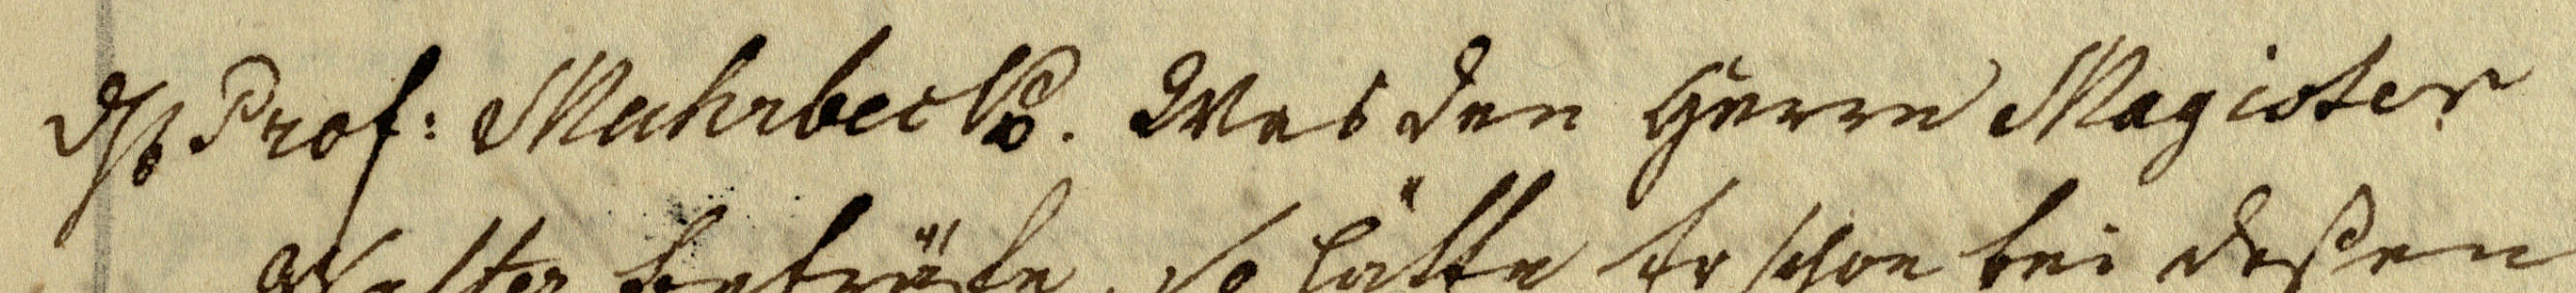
dh. Prof. Muhrbeck. Was den Herrn Magister
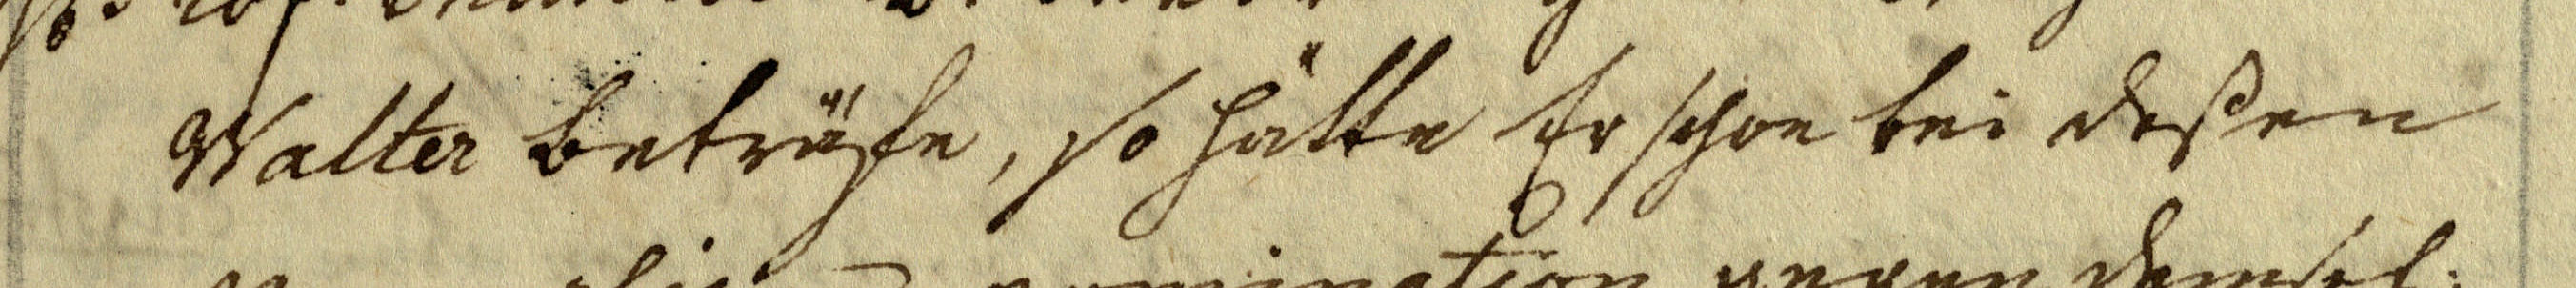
Walter beträfe, so hätte Er schon bei deßen
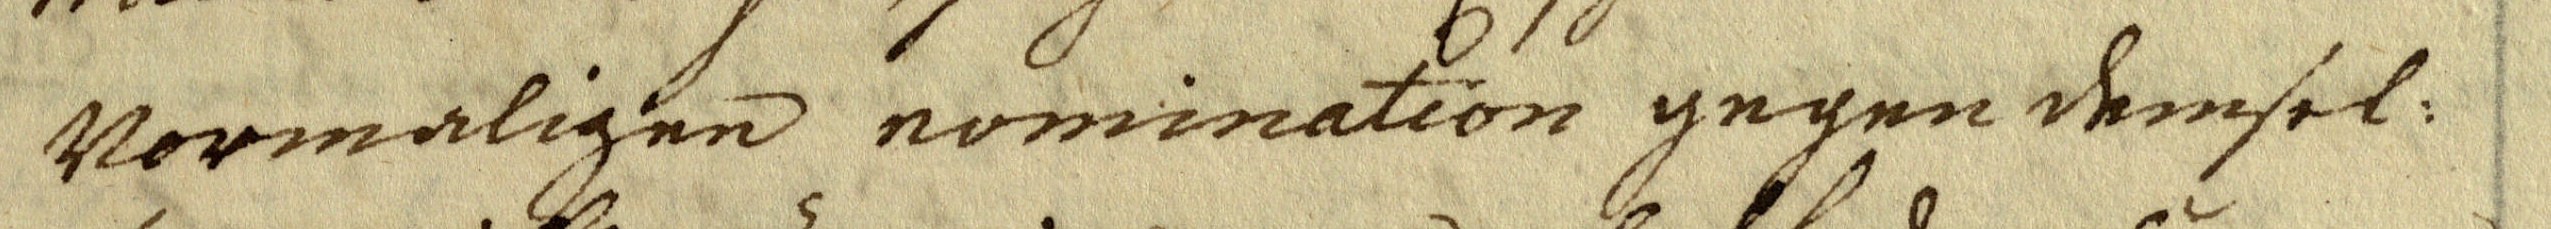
vormaligen nomination gegen demsel¬
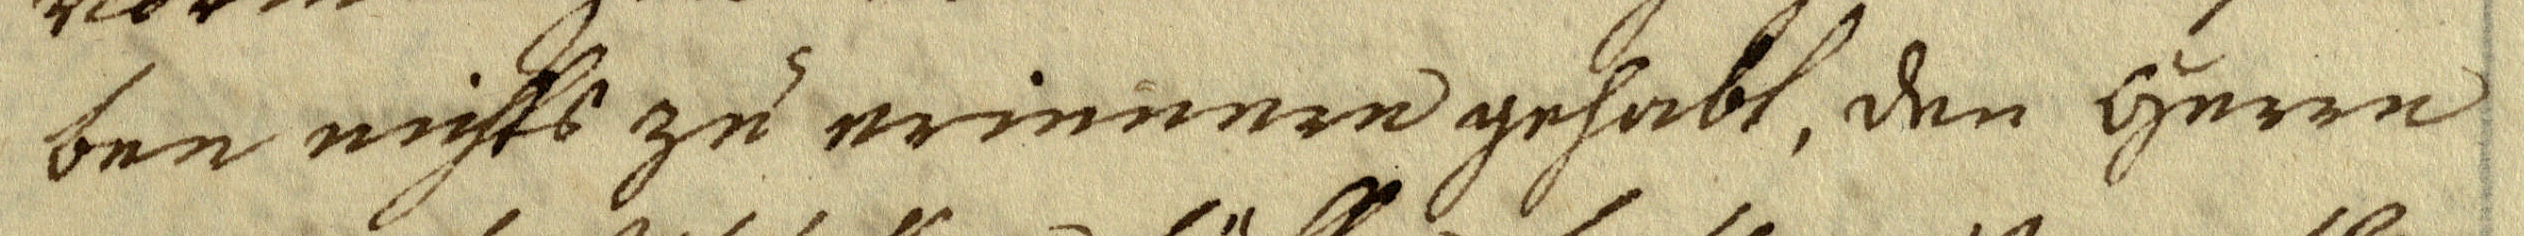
ben nichts zu erinnern gehabt, den Herrn
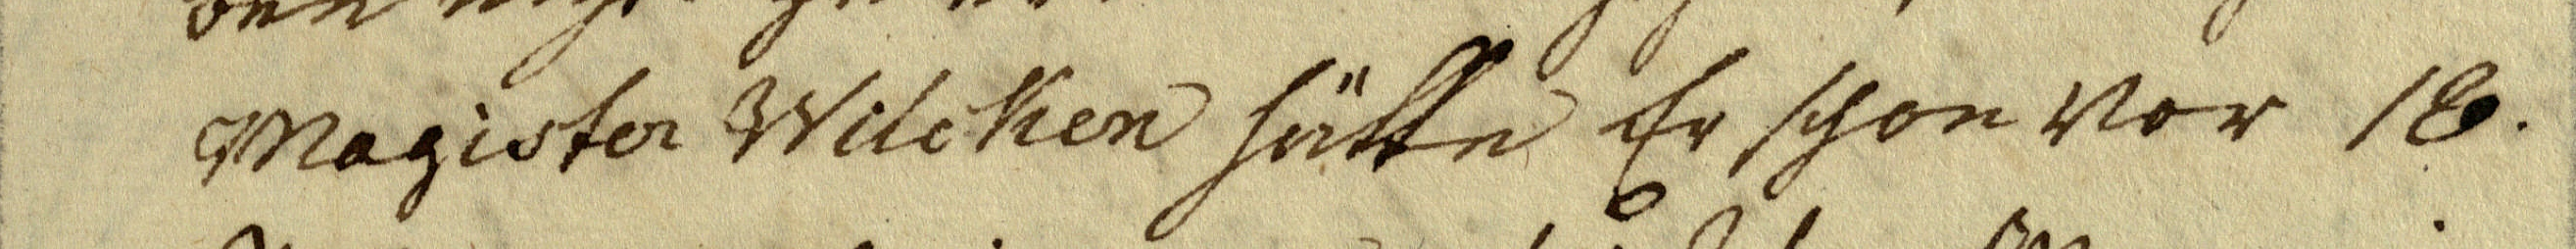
Magister Wilcken hätte Er schon vor 18.
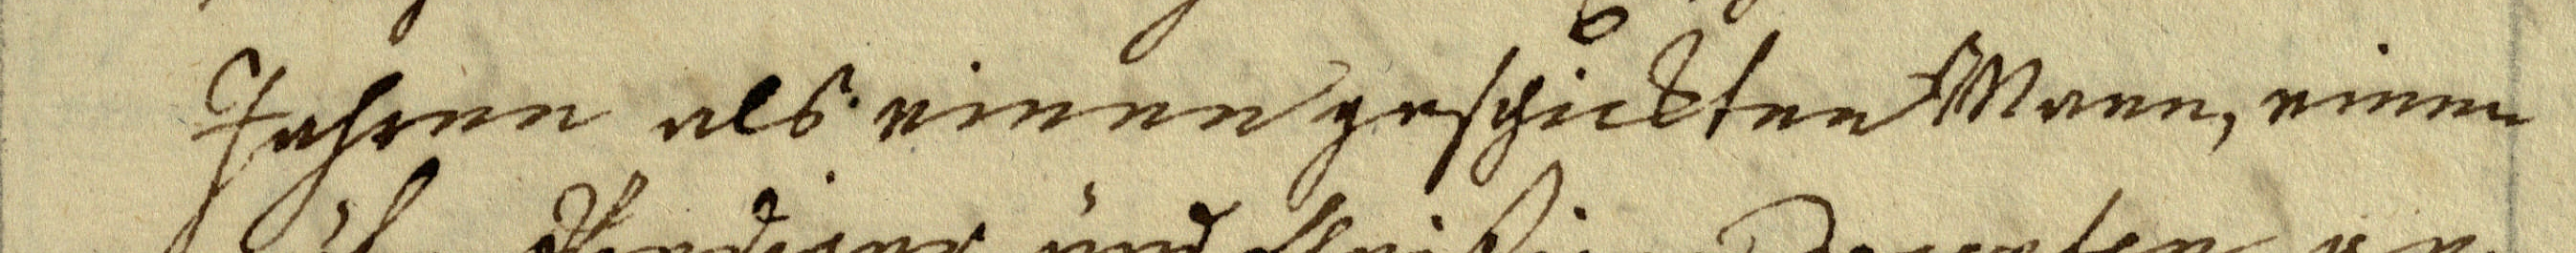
Jahren als einen geschickten Mann, einen
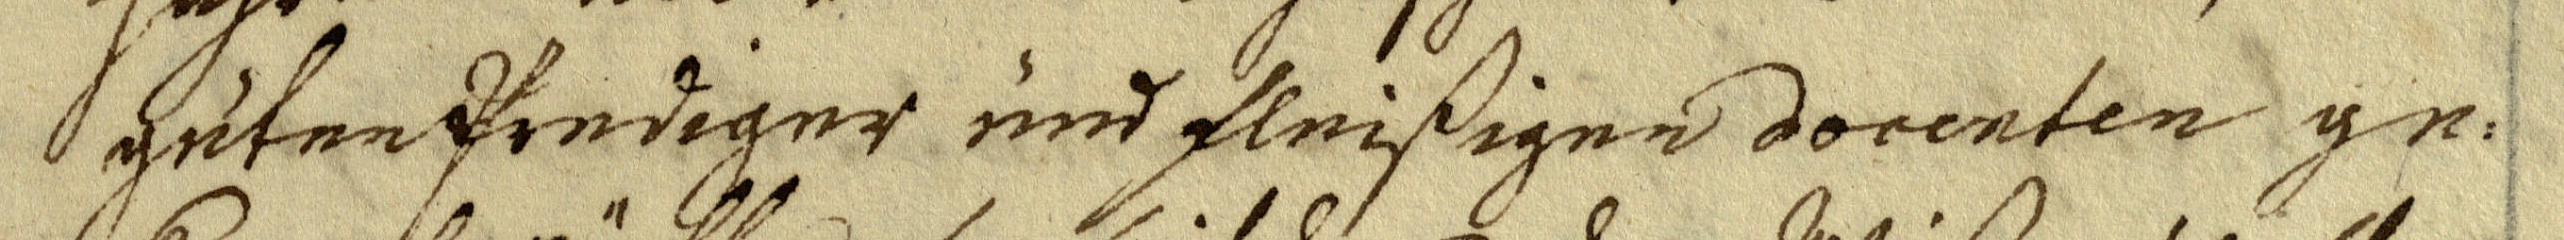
guten Prediger und fleißigen Docenten ge¬
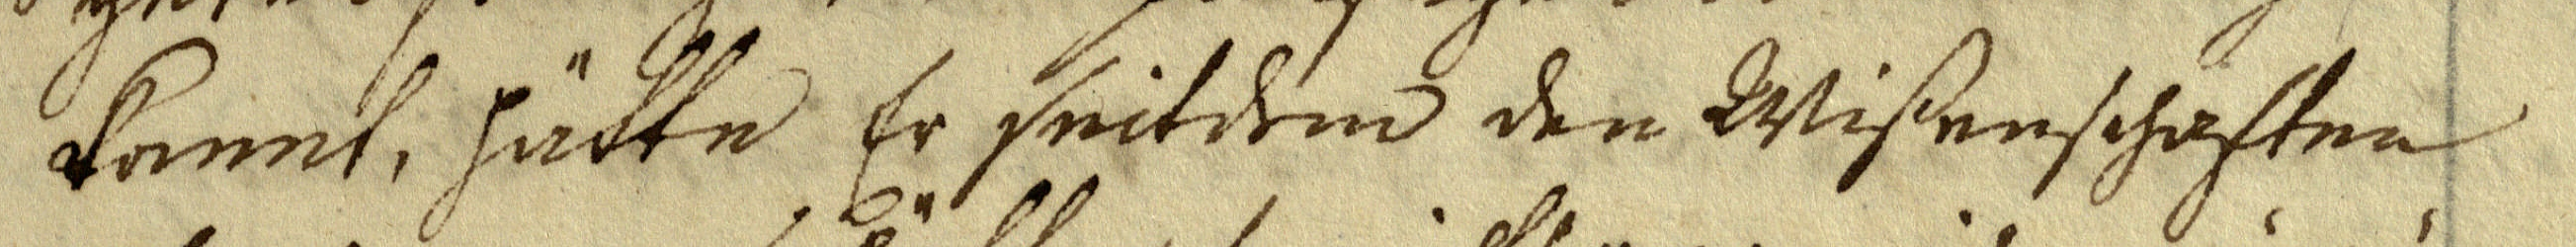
kannt, hätte Er seitdem den Wißenschaften
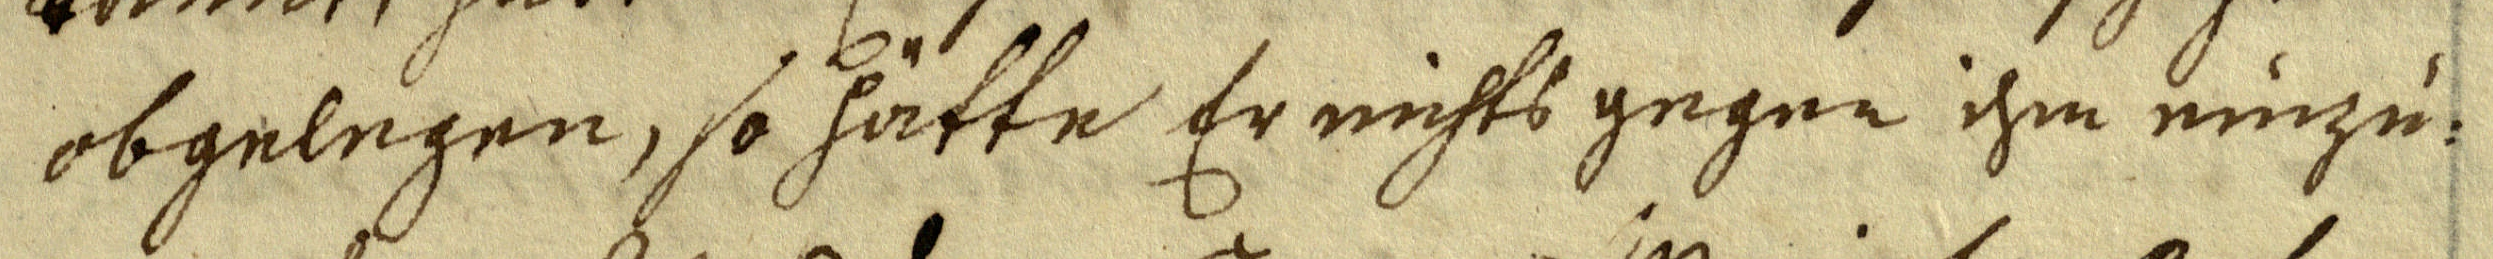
obgelegen, so hätte Er nichts gegen ihm einzu¬
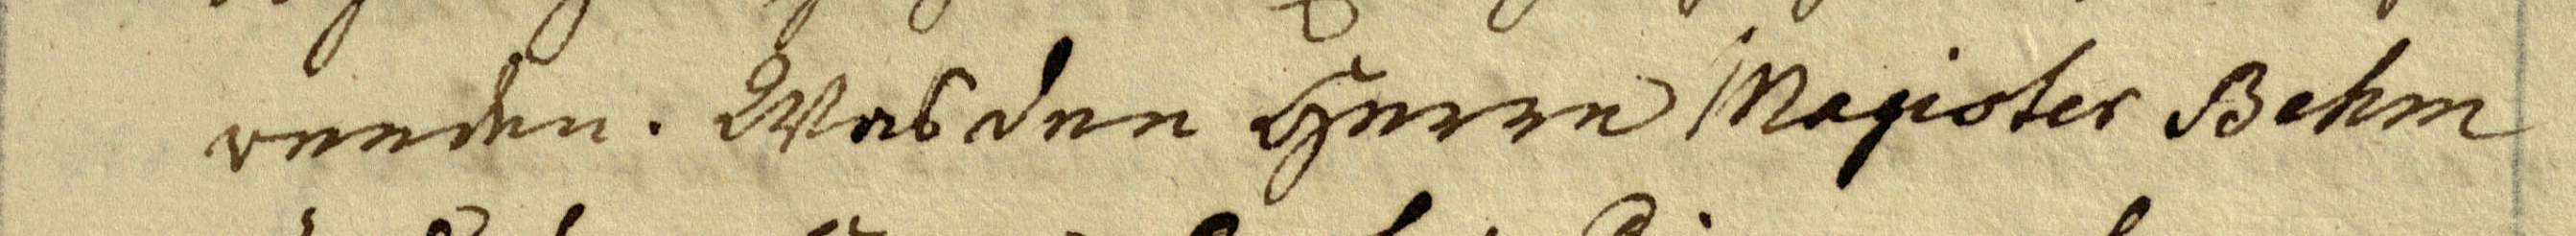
wenden. Was den Herrn Magister Behm
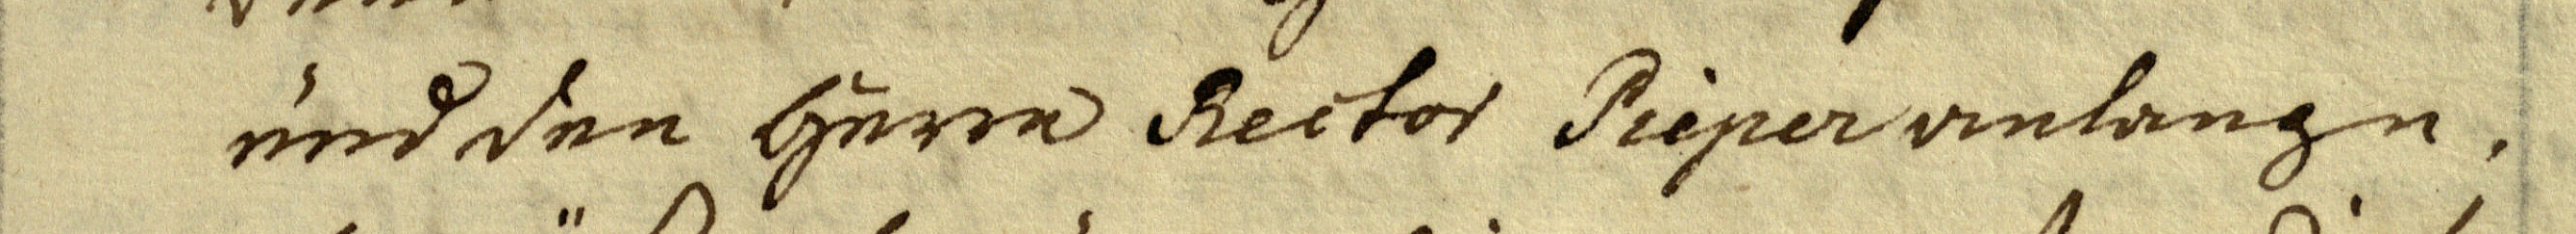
und den Herrn Rector Pieper anlange,
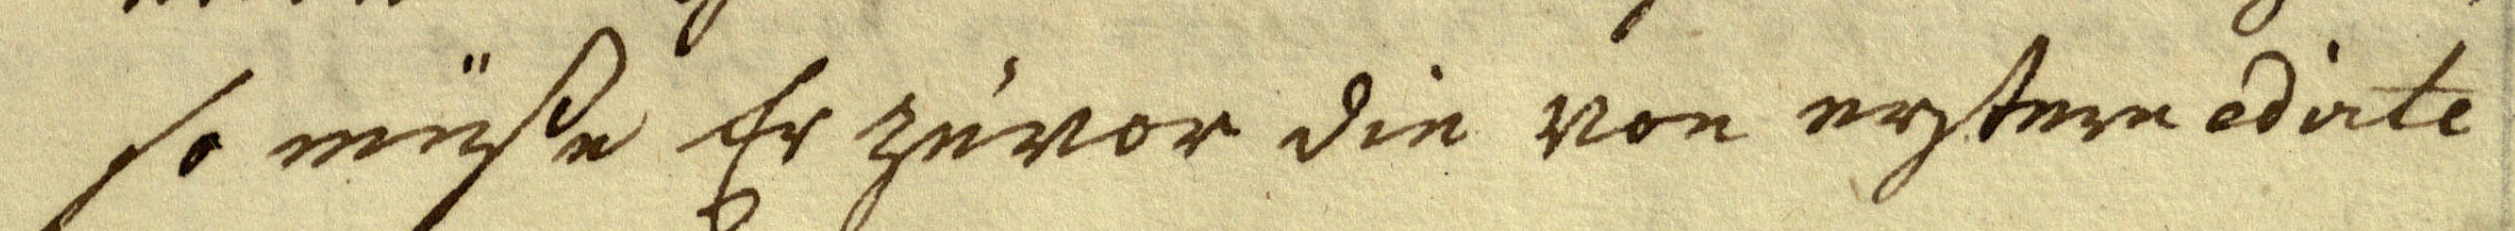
so müße Er zuvor die von erstern edirte
